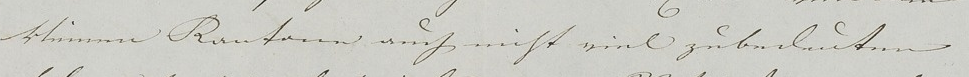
kleinen Kantone auch nicht viel zubedeuten
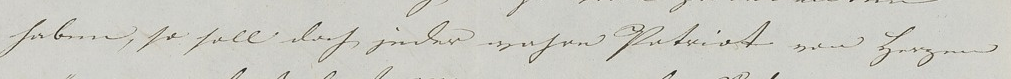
haben, so soll doch jeder wahre Patriot von Herzen
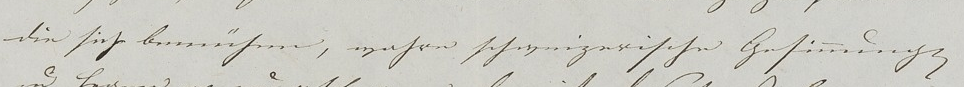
die sich bemühen, ware schweizerische Gesinnungen
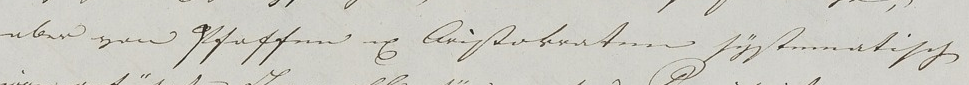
aber von Pfaffen & Aristokraten systematisch
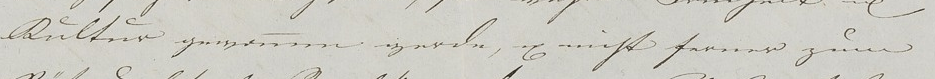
Kultur gewonnen werde, & nicht ferner zum
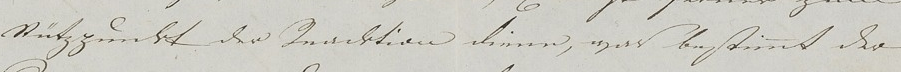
Stützpunkt der Reacktion diene, was bestimmt der
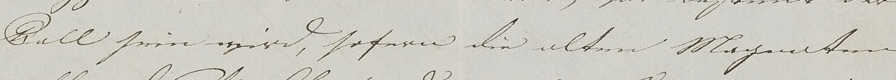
Fall sein wird, sofern die alten Magnaten
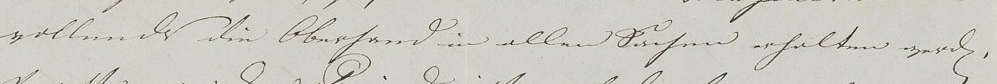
vollends die Oberhand in allen Sachen erhalten werden.
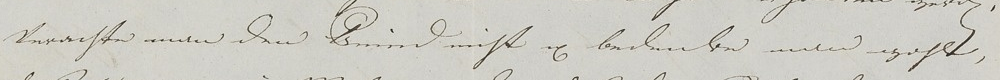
Verachte man den Feind nicht & bedenke man wohl,
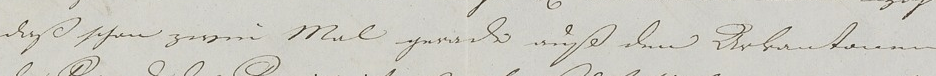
daß schon zwei Mal gerade auß den Urkantonen
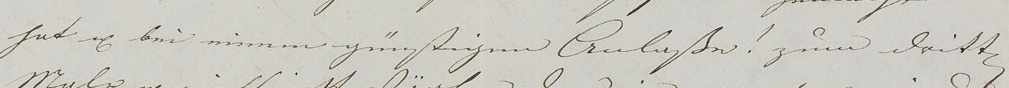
hat & bei einem günstigen Anlaße! zum dritten
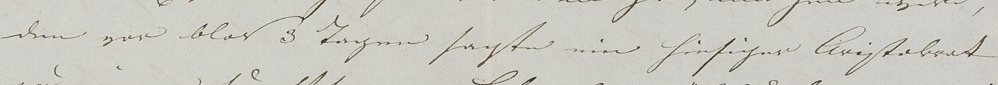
den vor blos 3 Tagen sagte ein hiesiger Aristokrat
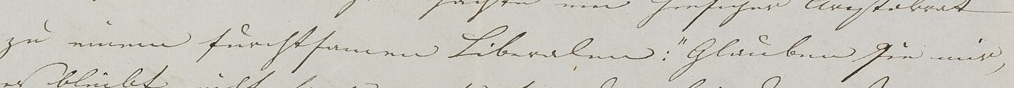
zu einem furchtsamen Liberalen: «Glauben Sie mir,
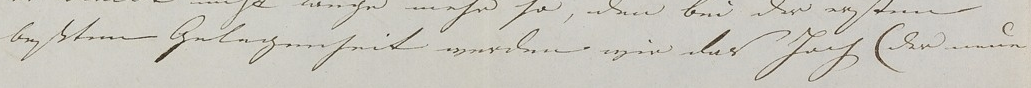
beßten Gelegenheit werden wir das Joch (der neue
